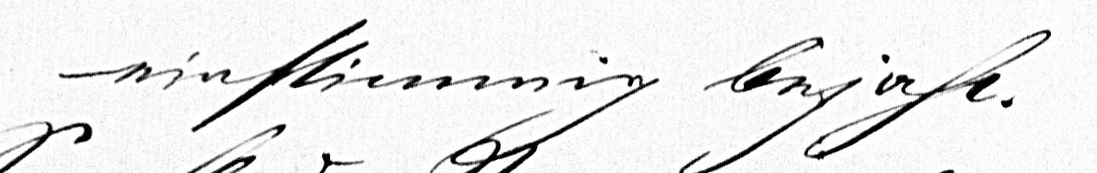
einstimmig bejaht.
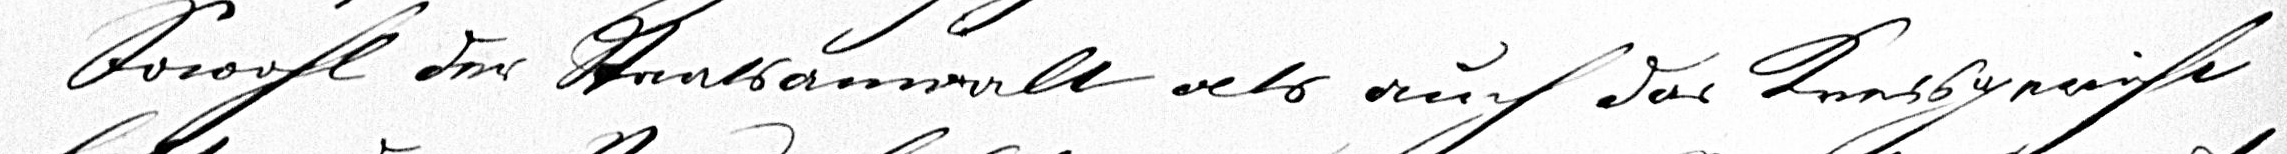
Sowohl der Staatsanwalt als auch das Kreisgericht
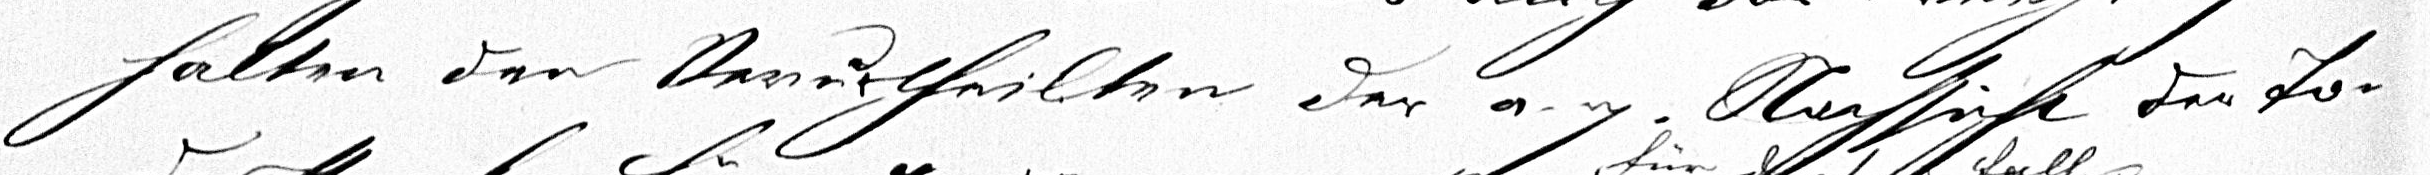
halten den Verurtheilten der a.g. Nachsicht der To¬
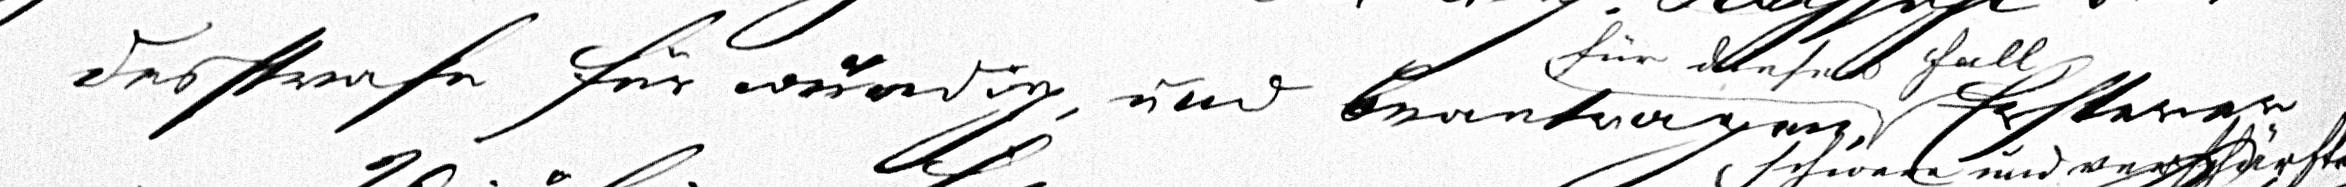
für diesen Fall
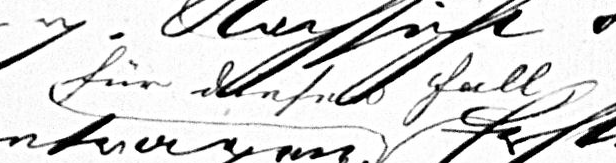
desstrafe für würdig, und beantragen, Ersterer
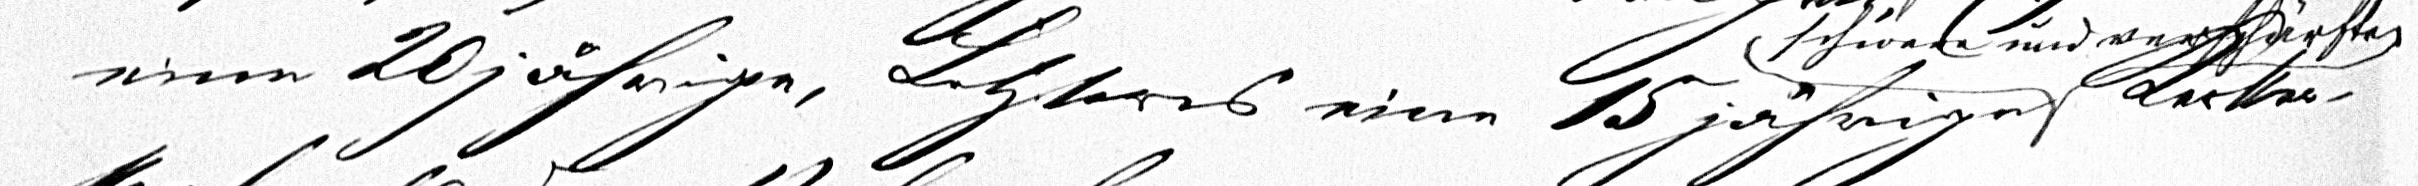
eine 20 jährige, Letzteres eine 15jährige Kerker¬
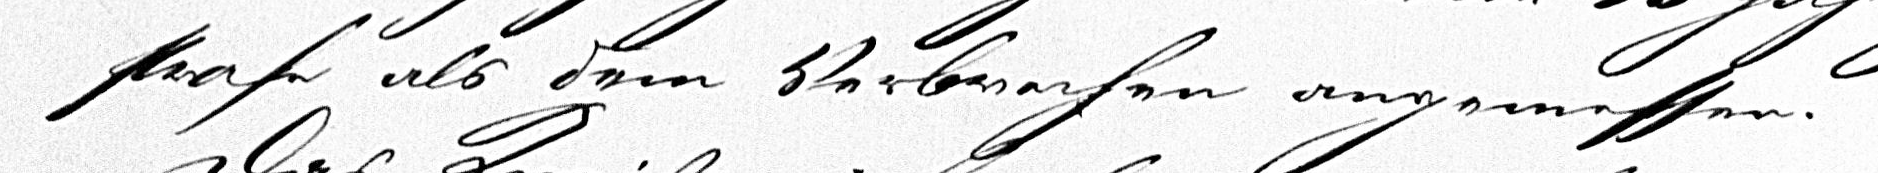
strafe als dem Verbrechen angemessen.
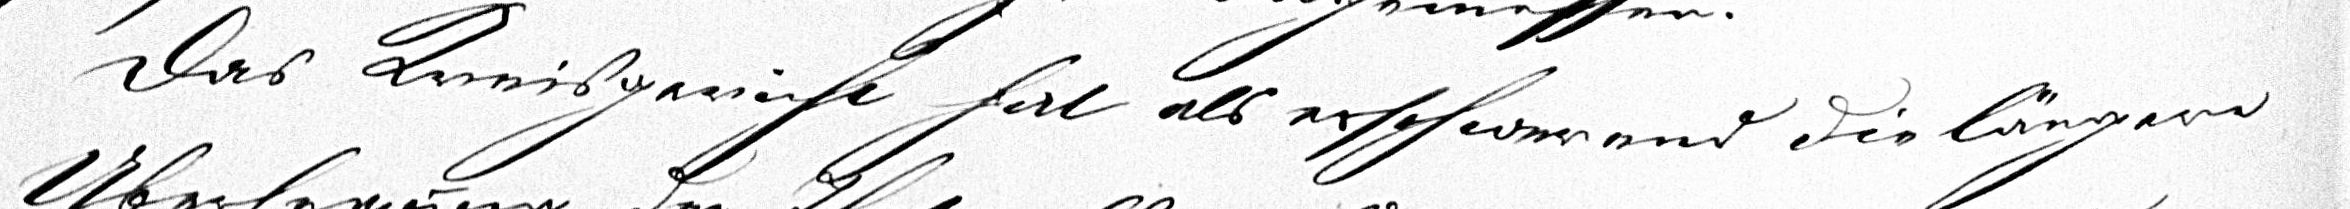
Das Kreisgericht hat als erschwerend die längere
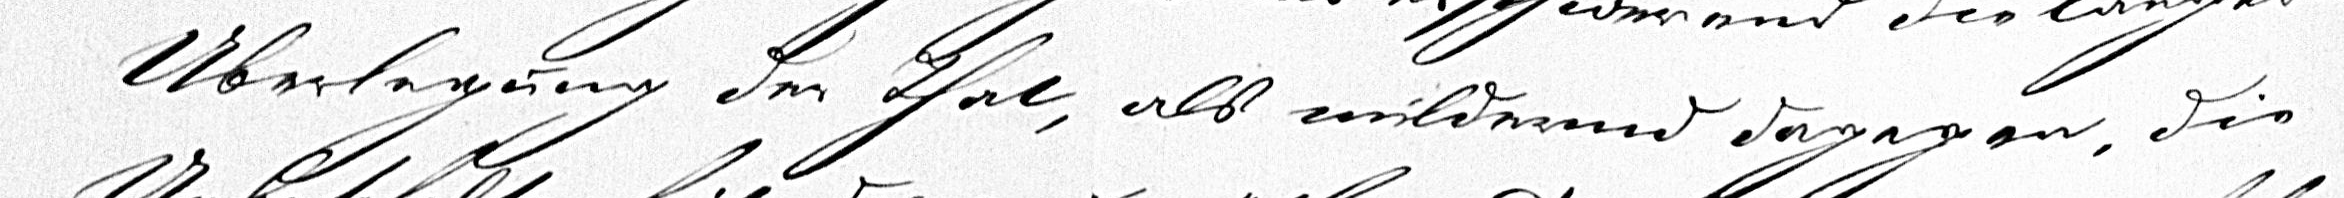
Uberlegung der That, als mildernd dagegen, die
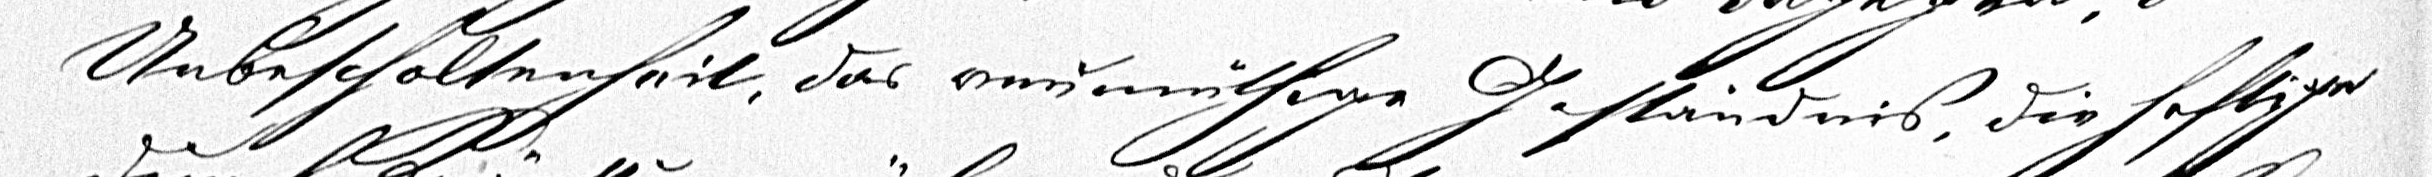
Unbescholtenheit, das reumütige Geständnis, die heftige
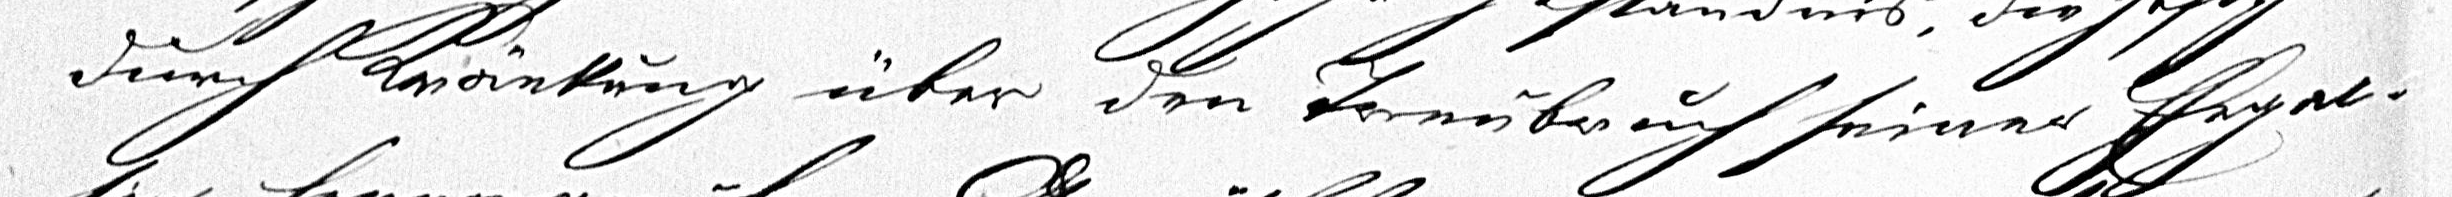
durch Kränkung über den Treubruch seiner Ehegat¬
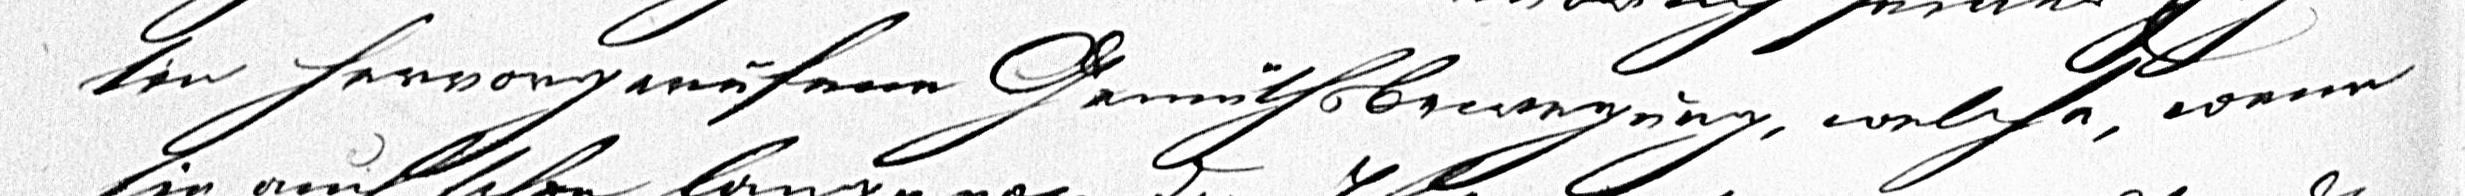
tin hervorgerufene Gemüthsbewegung, welche, wenn
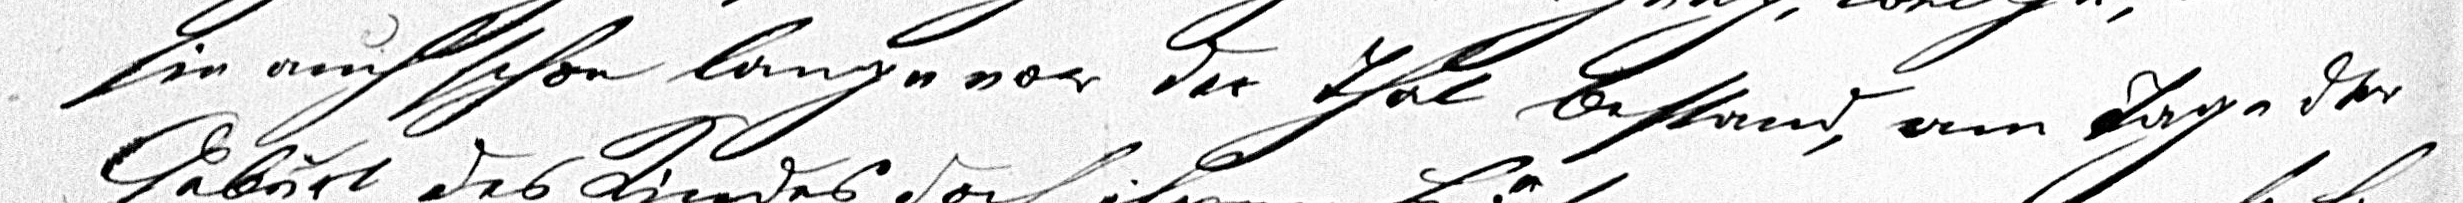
sie auch schon lange vor der That bestand, am Tage der
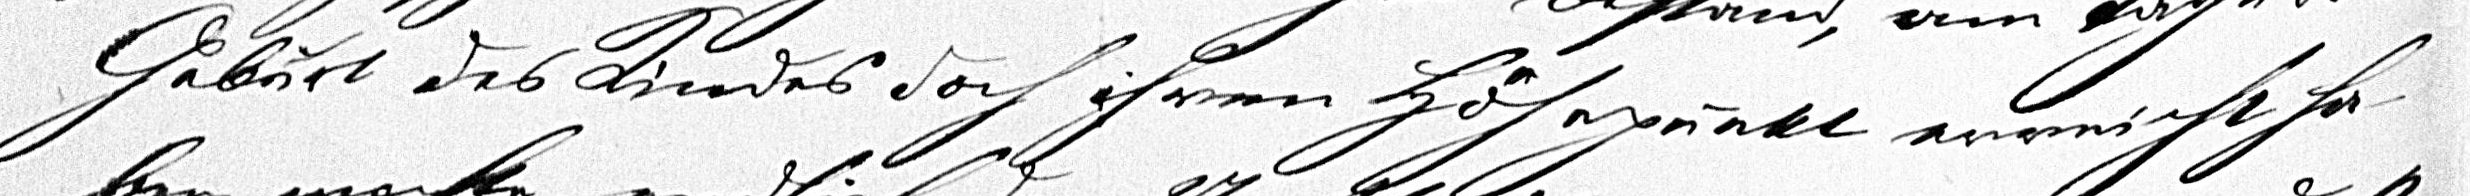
Geburt des Kindes doch ihren Höhepunkt erreicht ha¬
